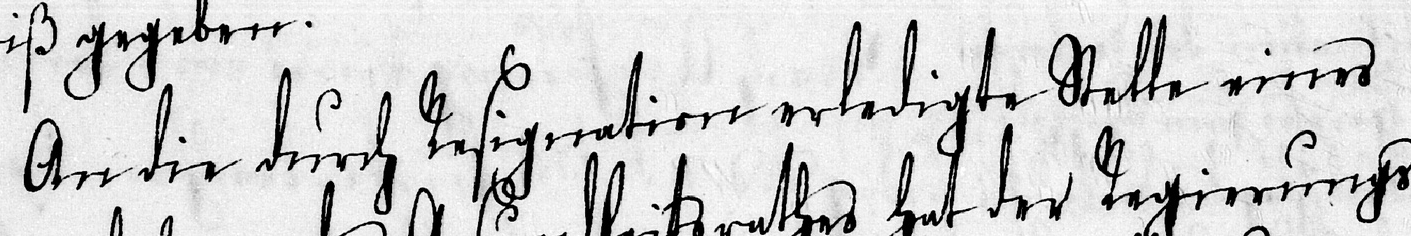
An die durch Resignation erledigte Stelle eines
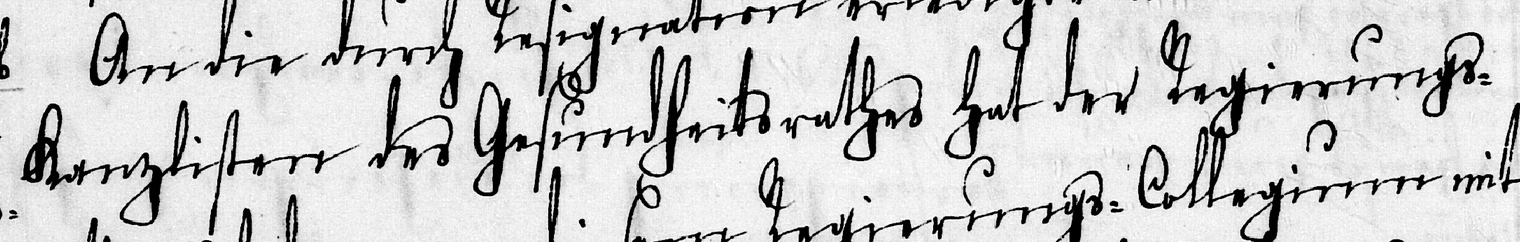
Kanzlisten des Gesundheitsrathes hat der Regierungs¬
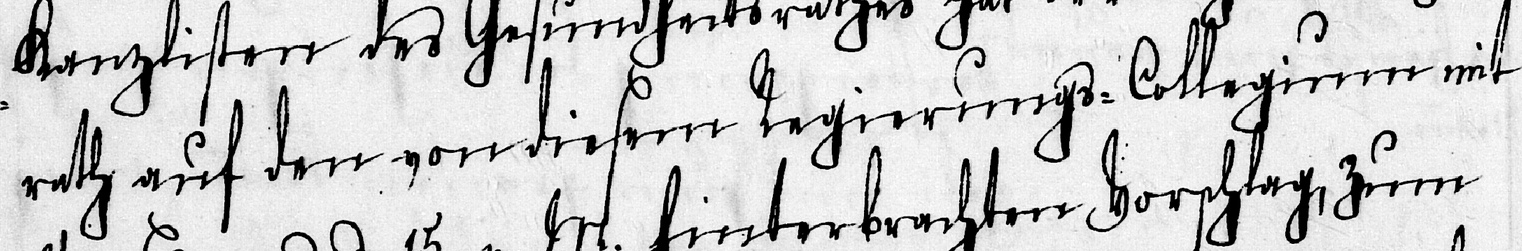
rath auf den von diesem Regierungs-Collegium mit
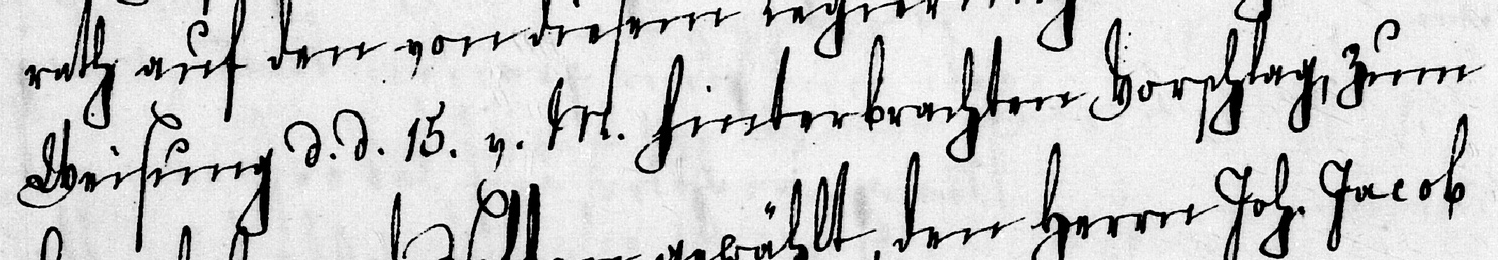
Weisung d. d. 15. v. M. hinterbrachten Vorschlag, zum
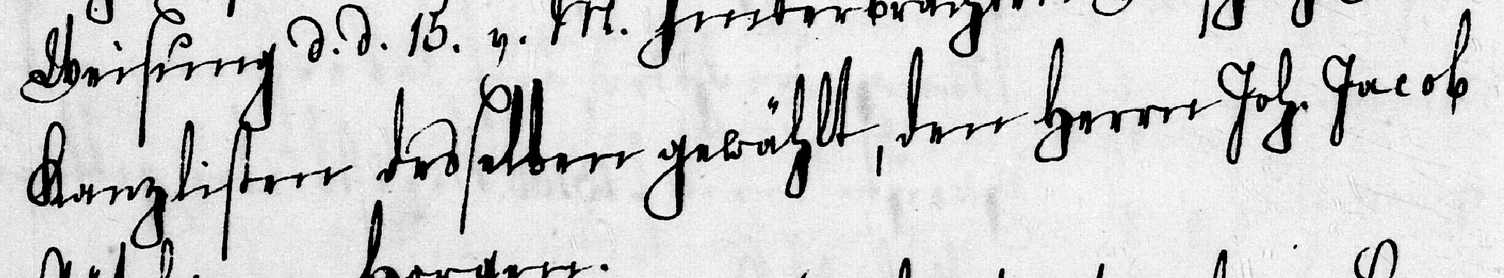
Kanzlisten desselben gewählt, den Herrn Joh. Jacob
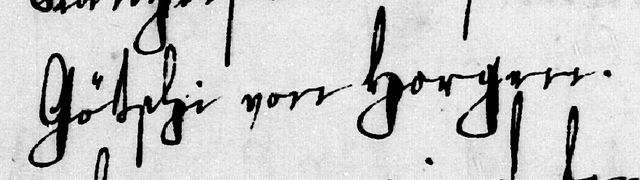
Götschi von Horgen.
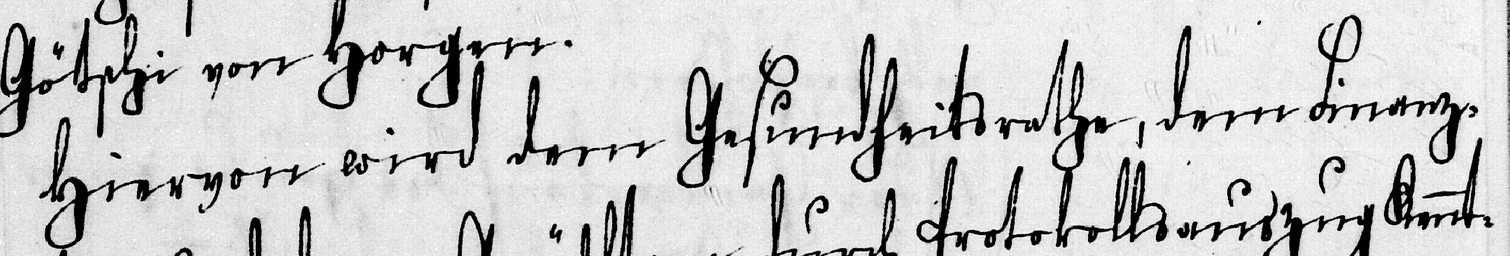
Hiervon wird dem Gesundheitsrathe, dem Finanz¬
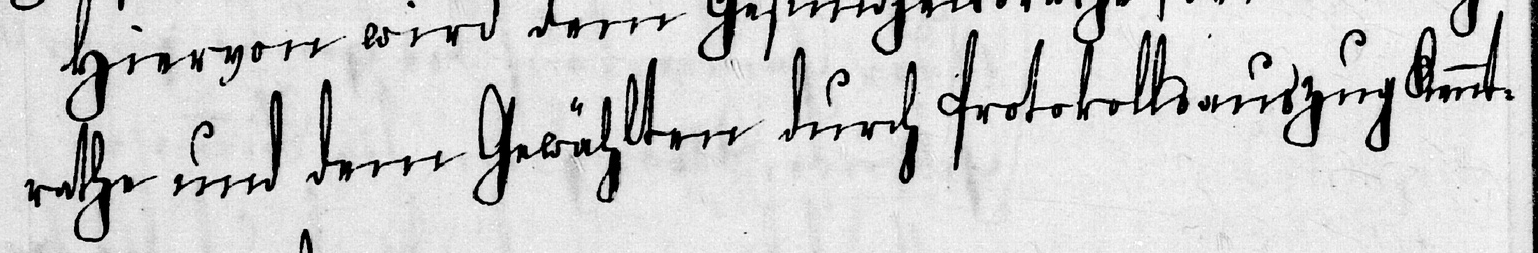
rathe und dem Gewählten durch Protokollsauszug Kenn¬
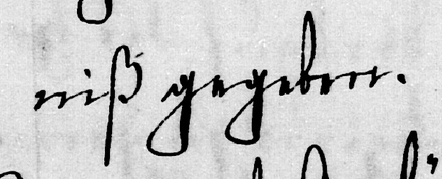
tniß gegeben.
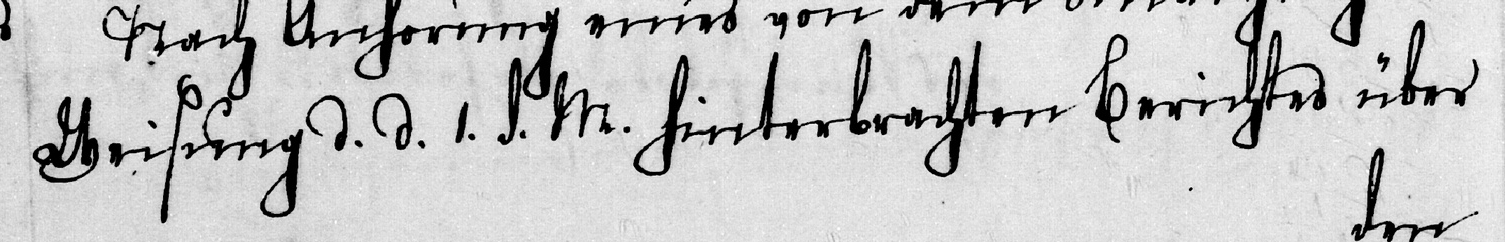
Weisung d. d. 1. d. M. hinterbrachten Berichtes über
